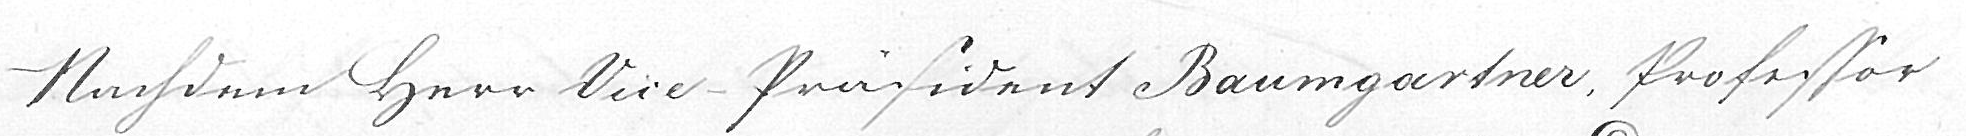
Nachdem Herr Vice Präsident Baumgartner, Professor
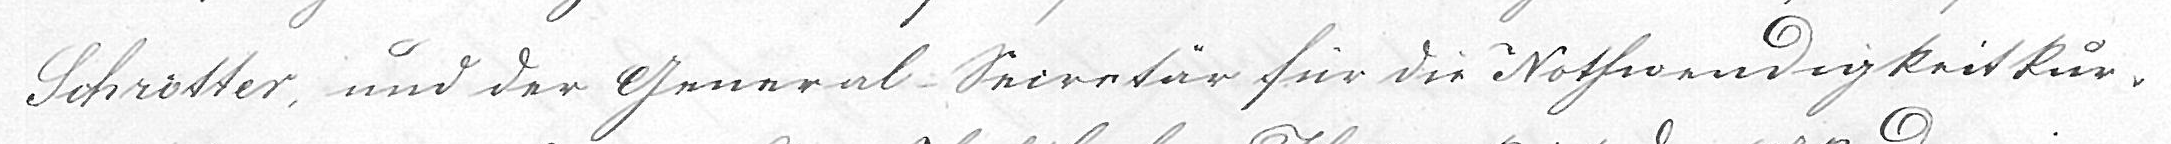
Schrötter, und der General Secretär für die Nothwendigkeit kur-
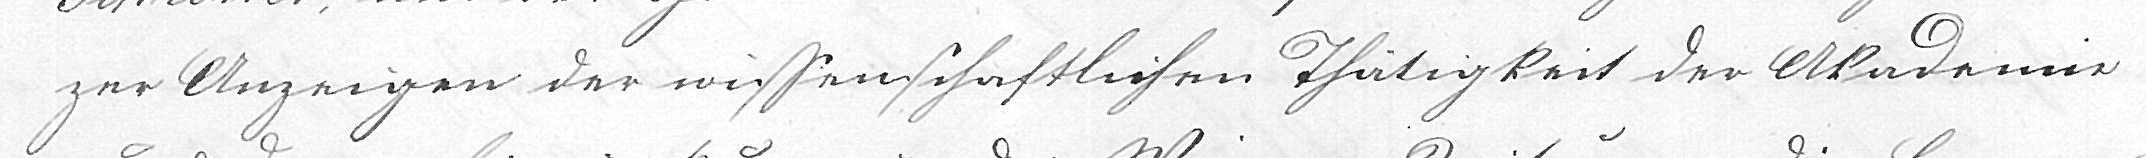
zer Anzeigen der wissenschaftlichen Thätigkeit der Akademie
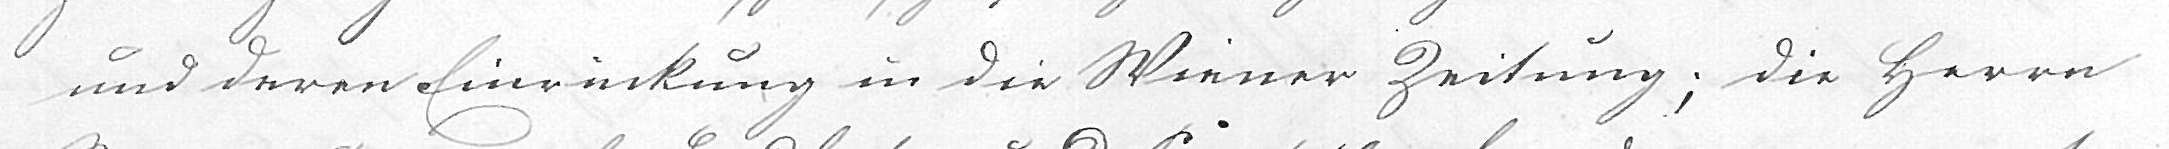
und deren Einrückung in die Wiener Zeitung; die Herrn
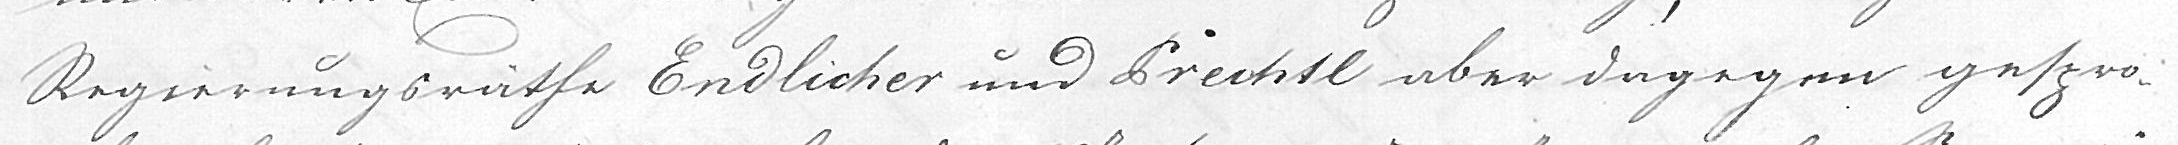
Regierungsräthe Endlicher und Prechtl aber dagegen gespro-
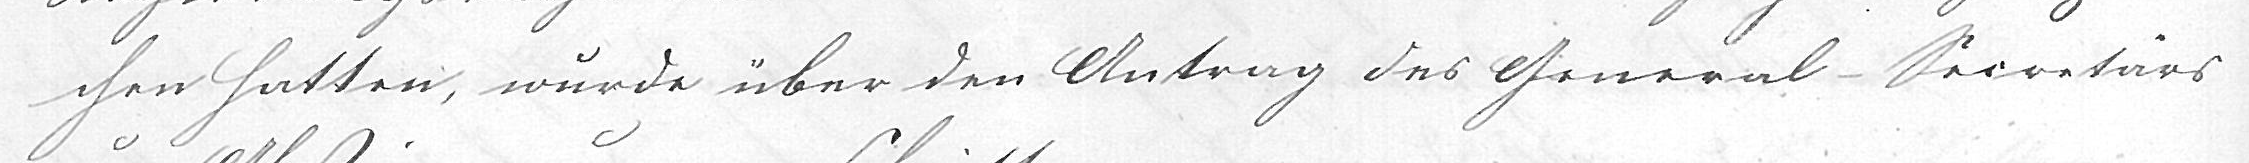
chen hatten, wurde über den Antrag des General-Secretärs
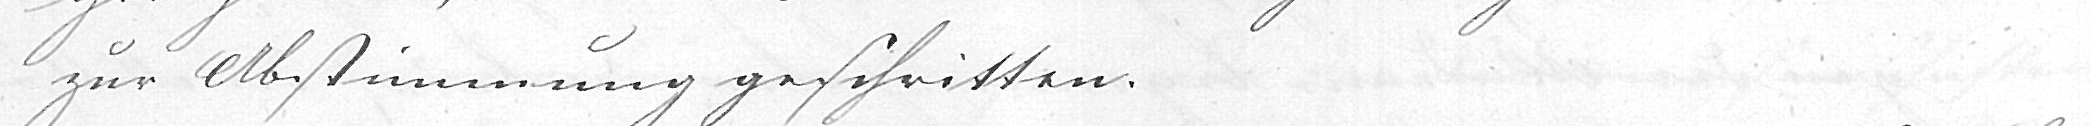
zur Abstimmung geschritten.
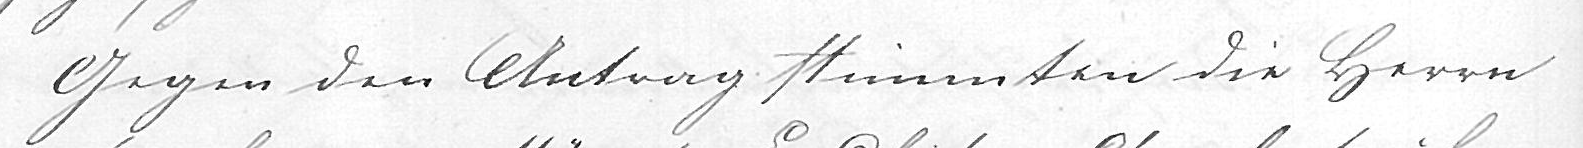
Gegen den Antrag stimmten die Herrn
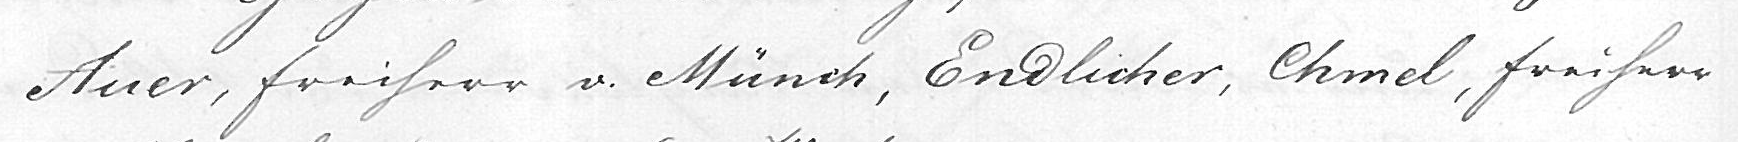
Auer, Freiherr v. Münch, Endlicher, Chmel, Freiherr
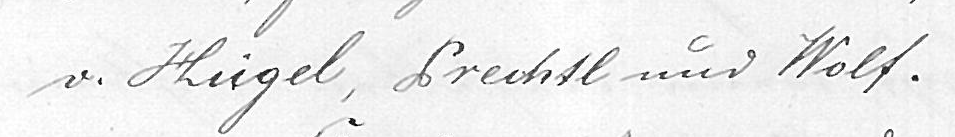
v. Hügel, Prechtl und Wolf.
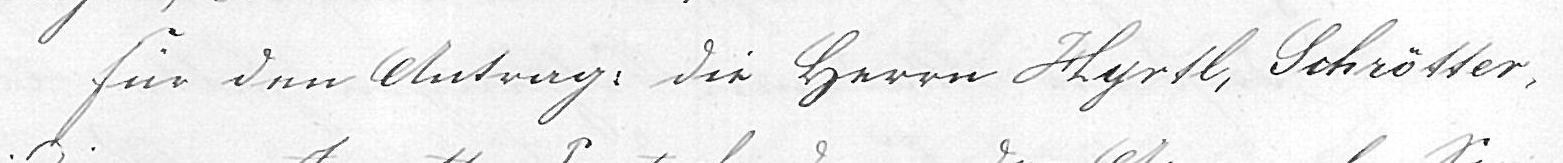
Für den Antrag: die Hern Hyrtl, Schrötter,
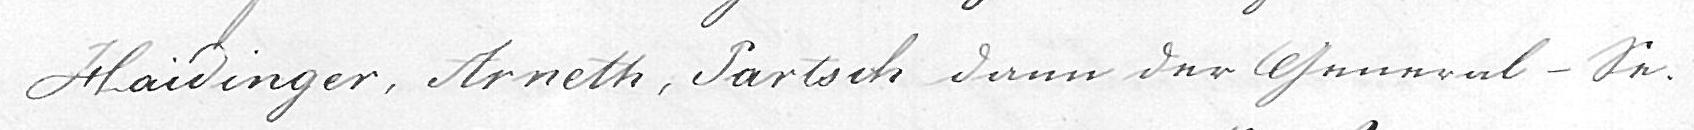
Haidinger, Arneth, Partsch dann der General-Se-
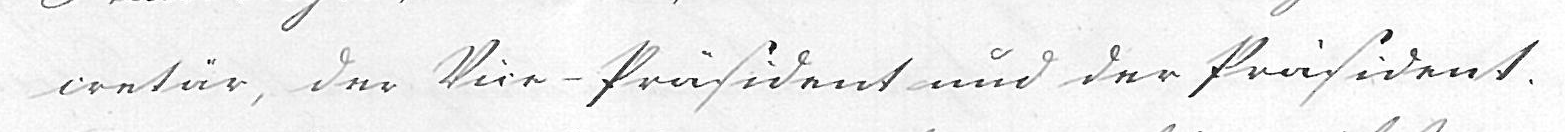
cretär, der Vice-Präsident und der Präsident.
